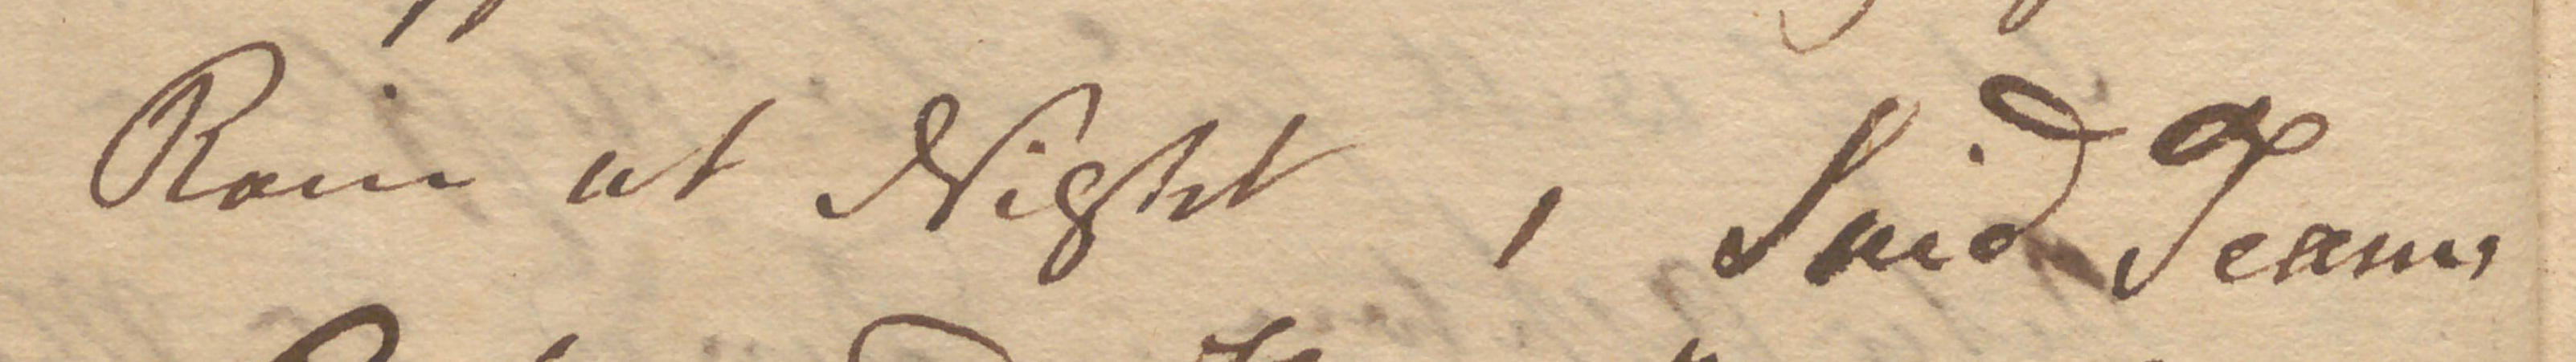Rain at Night, Said Teams
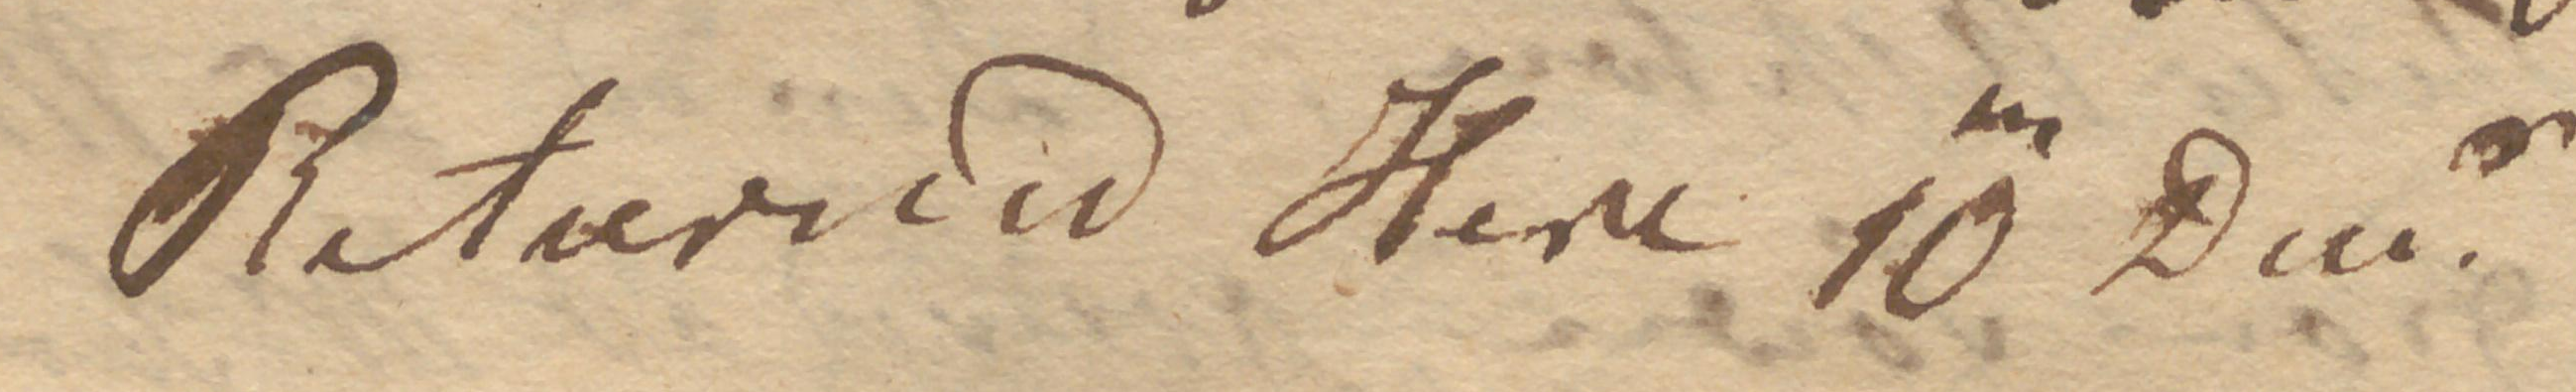Returiced Here 10^th Dece^r.
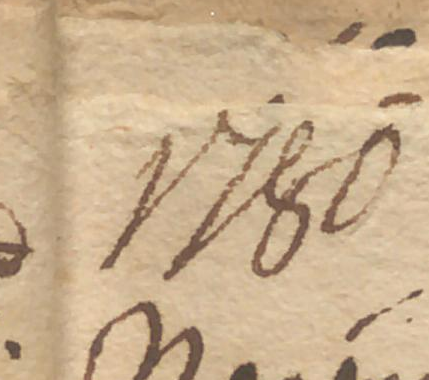1780
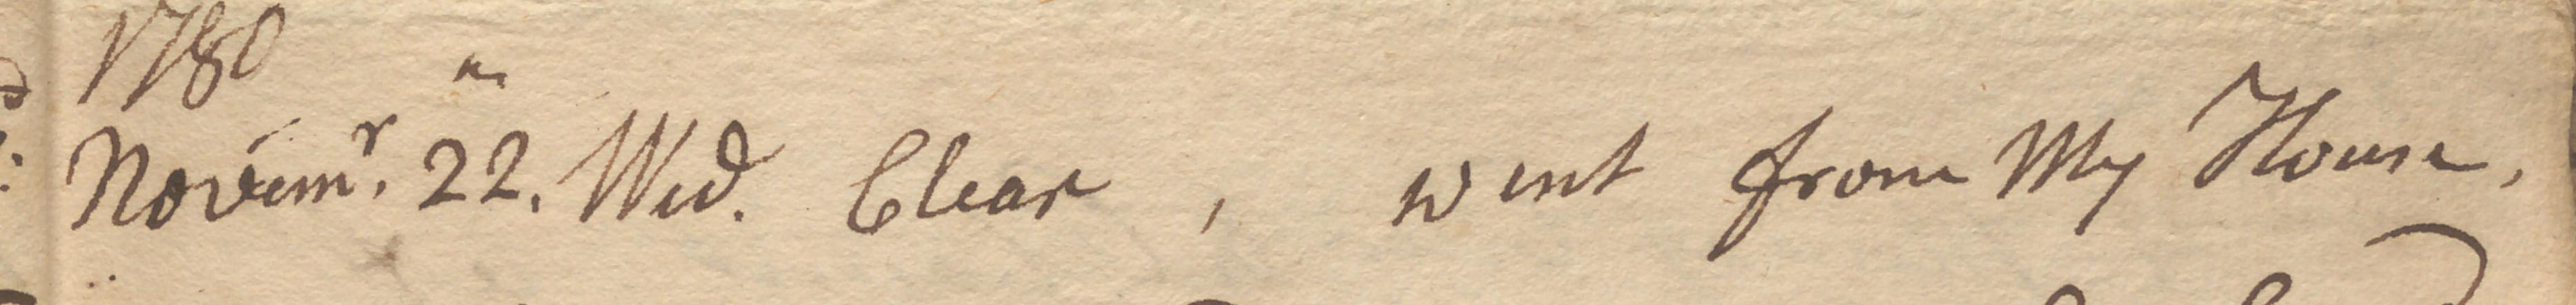Novem^r. 22^th. Wed. Clear, went from My House
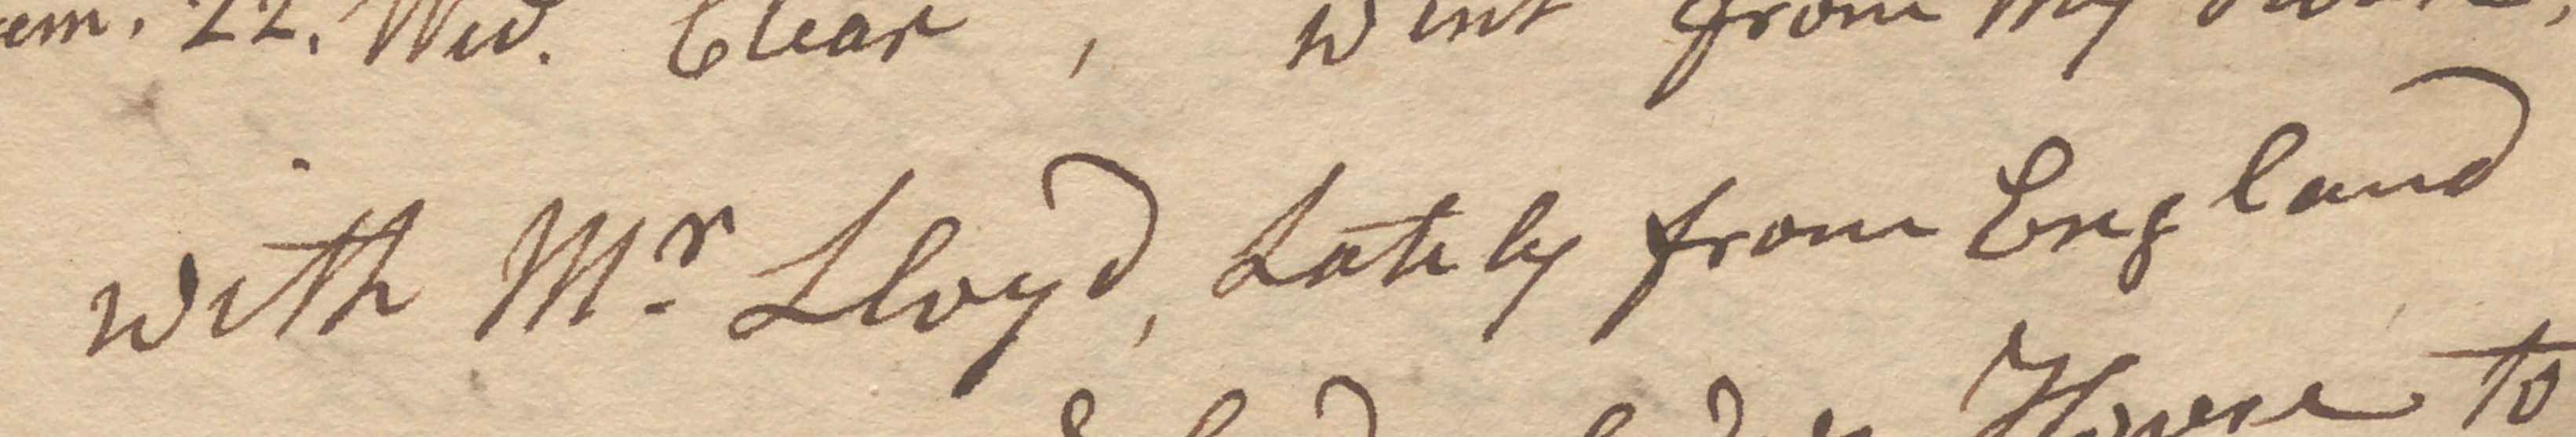with M^r. Lloyd Lately from England
